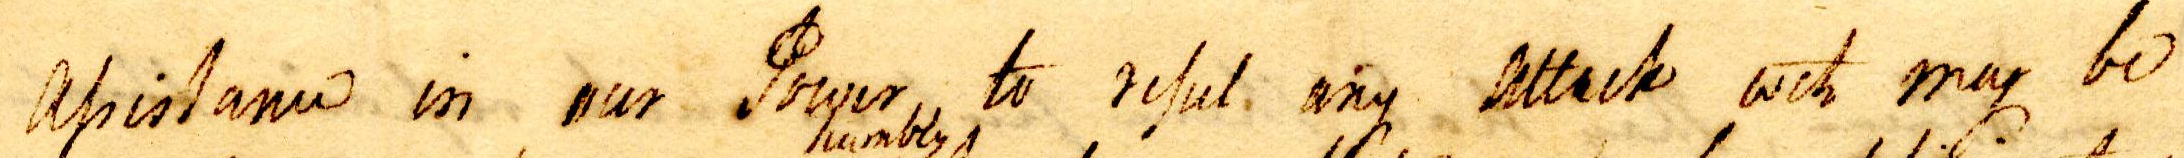Assistance in our Power, to repel any Attack wch may be
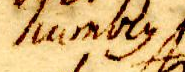humbly
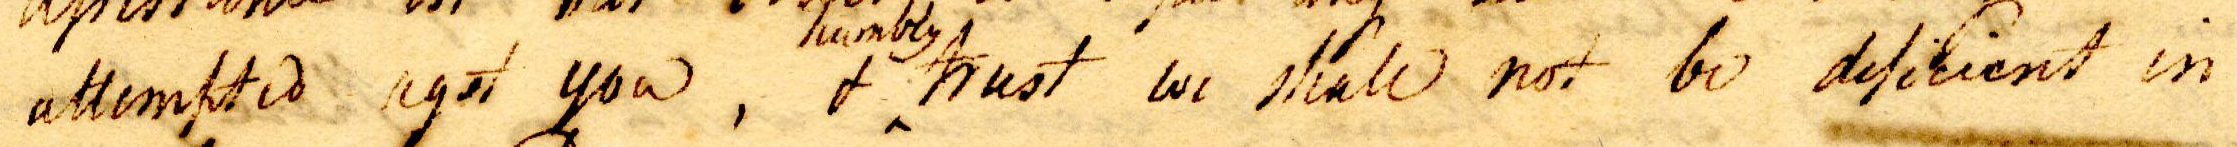attempted to get you, & ^ trust we shall not be deficient in
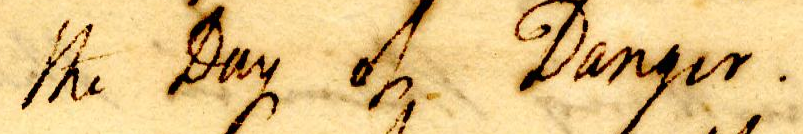the Day of Danger.
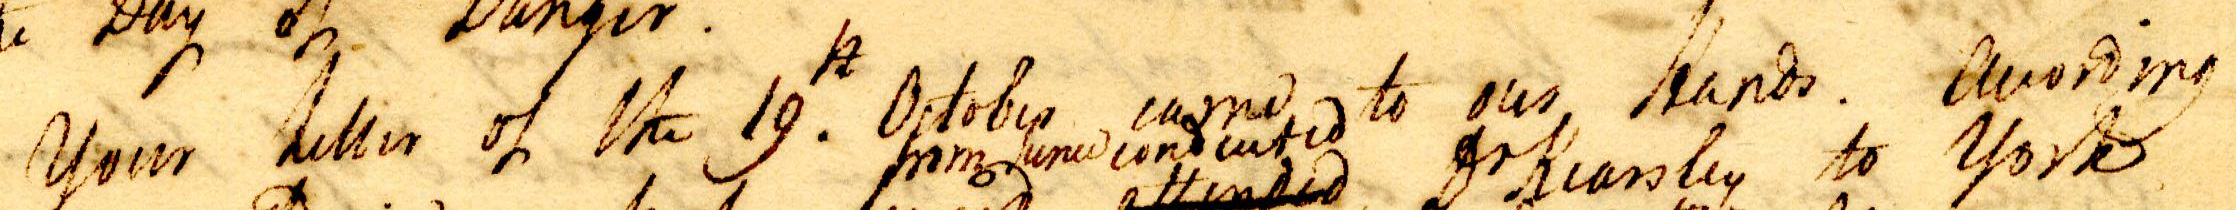Your Letter of the 19^th. October came to our hands. According
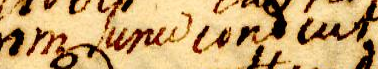from since conducted
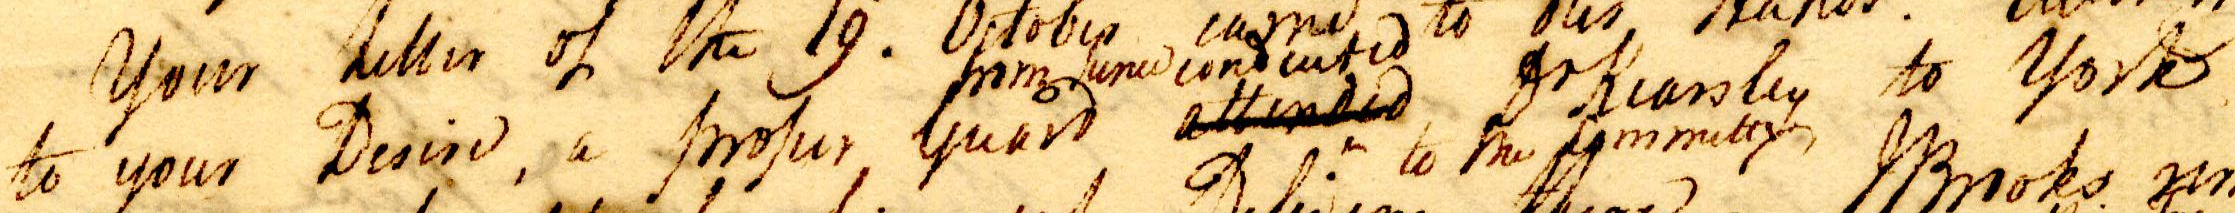to your Desire a proper Guard attended D^r Kearsley to York
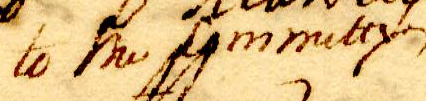to the Committee
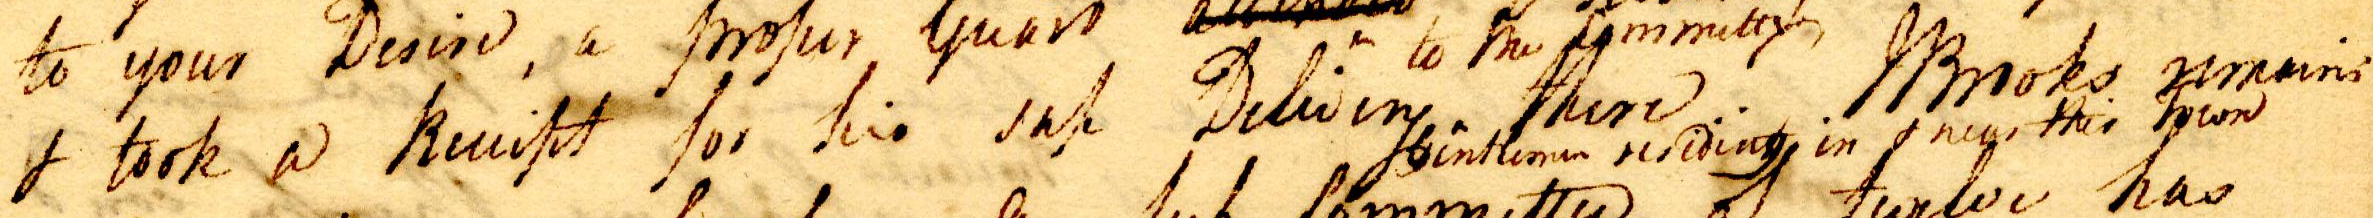& took a Receipt for his sap Delivery ^ there. J Brooks remains
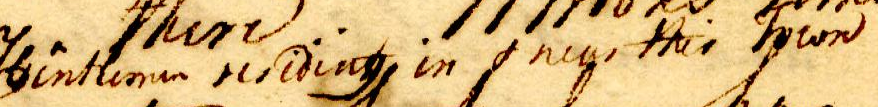Gentlemen resident in & near this Town
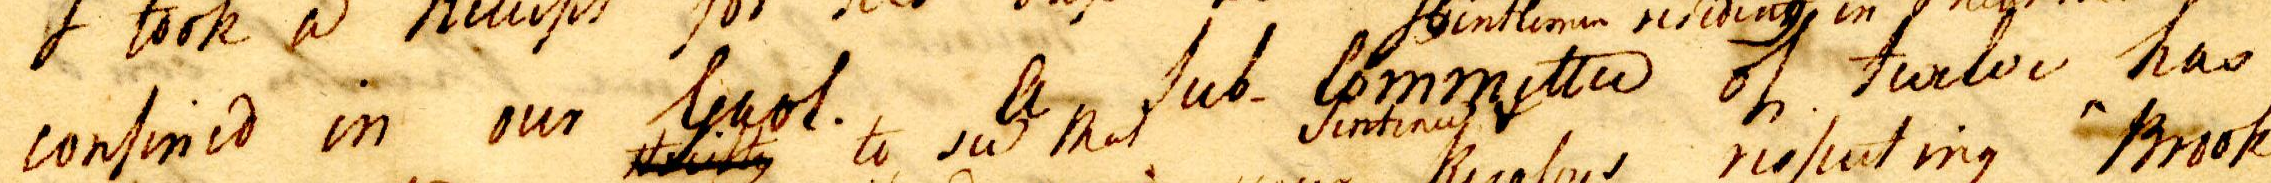confined in our Gaol. A Sub. Committee of Twelve ^ has
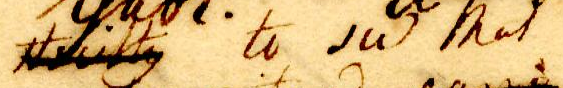thirty to see that
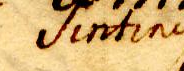Sentence
